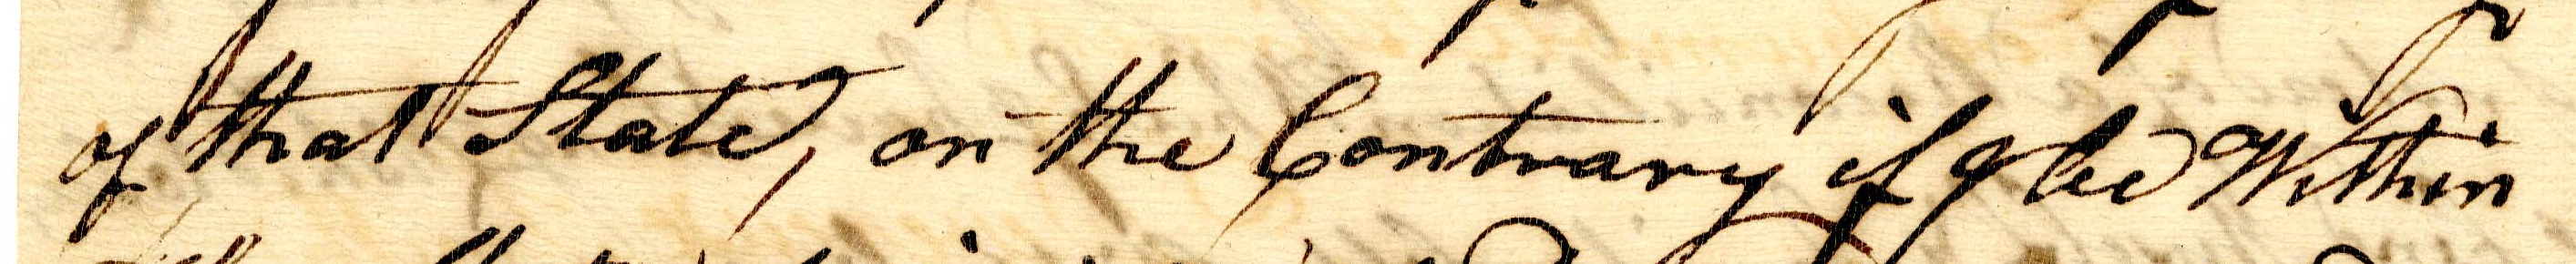of that State, on the Contrary if I be Within
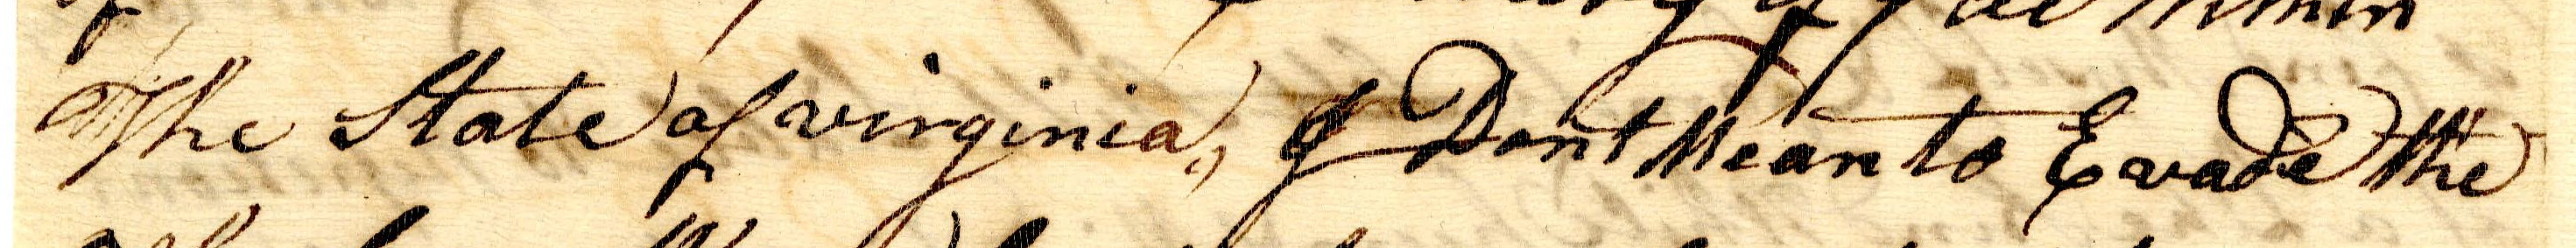The State of virginia, & Don^t Mean to Evade the
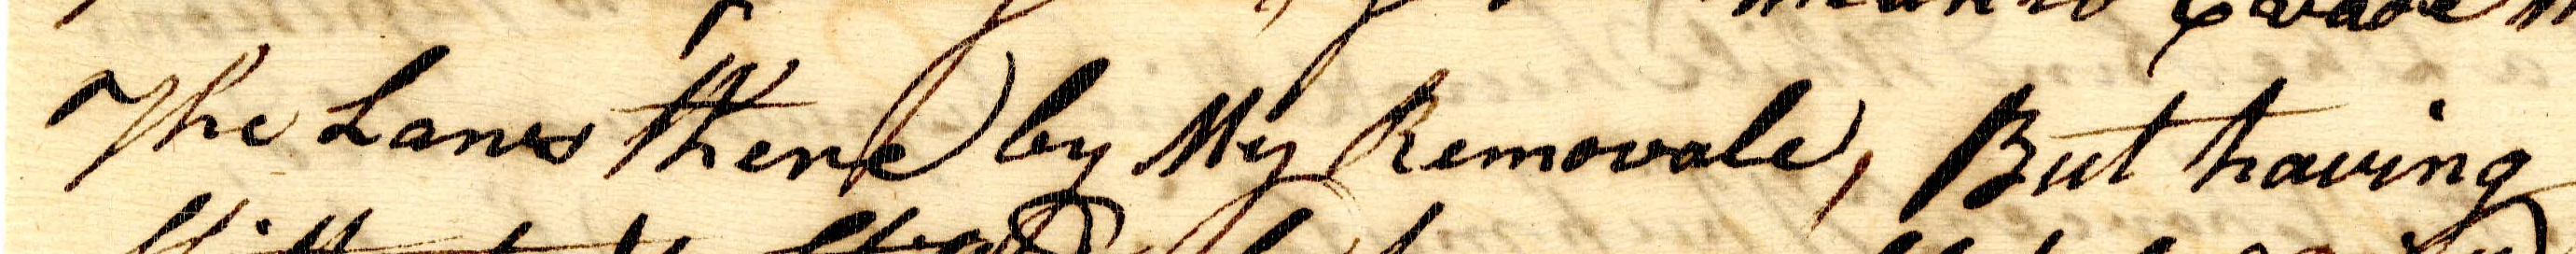The Laws there by My Removale, But having
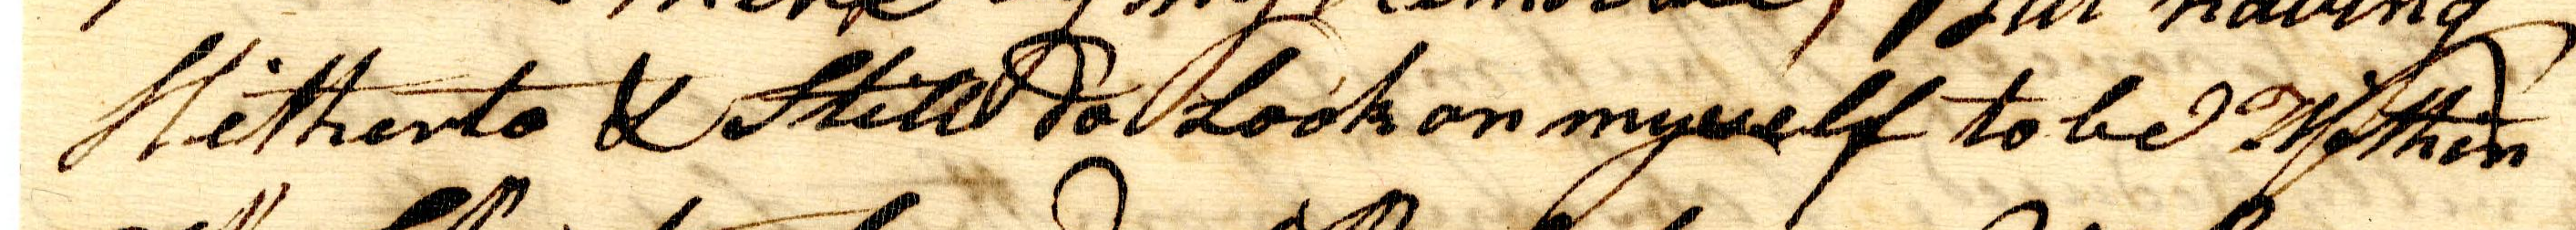Hitherto & Still to Look on myself to be Wither
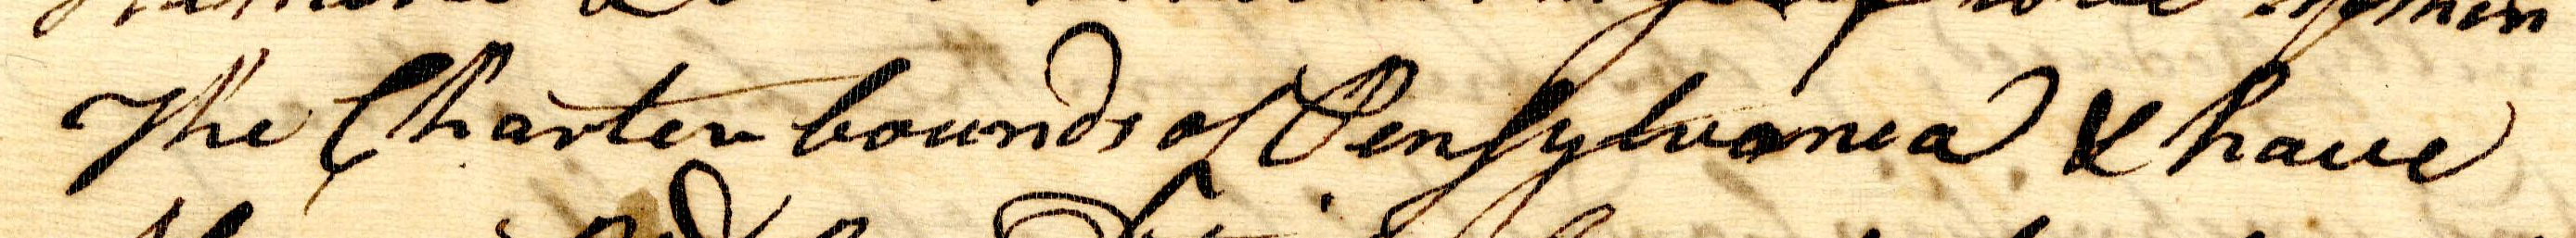the Charter bounds of Pensylvania, & have
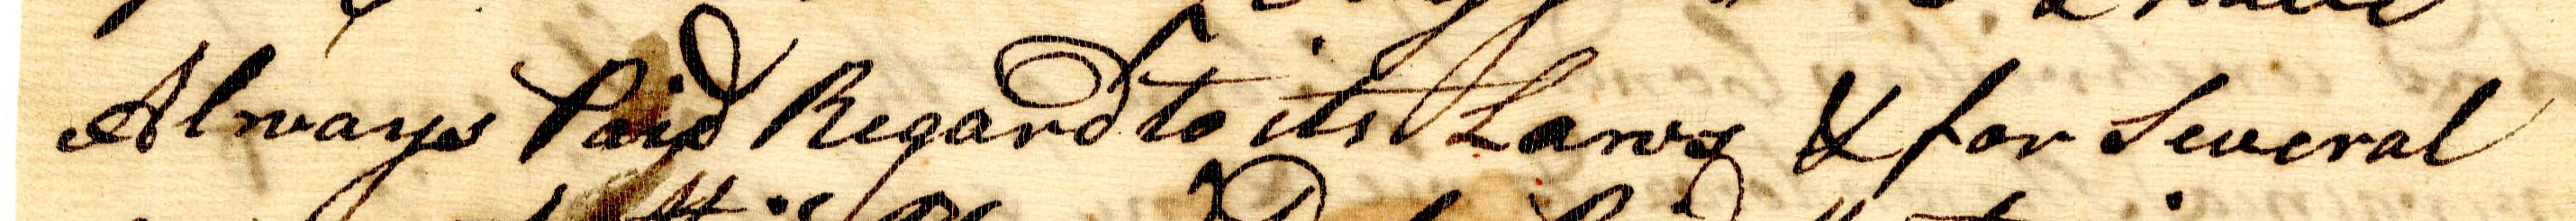Always Paid Regard to its Laws & for several
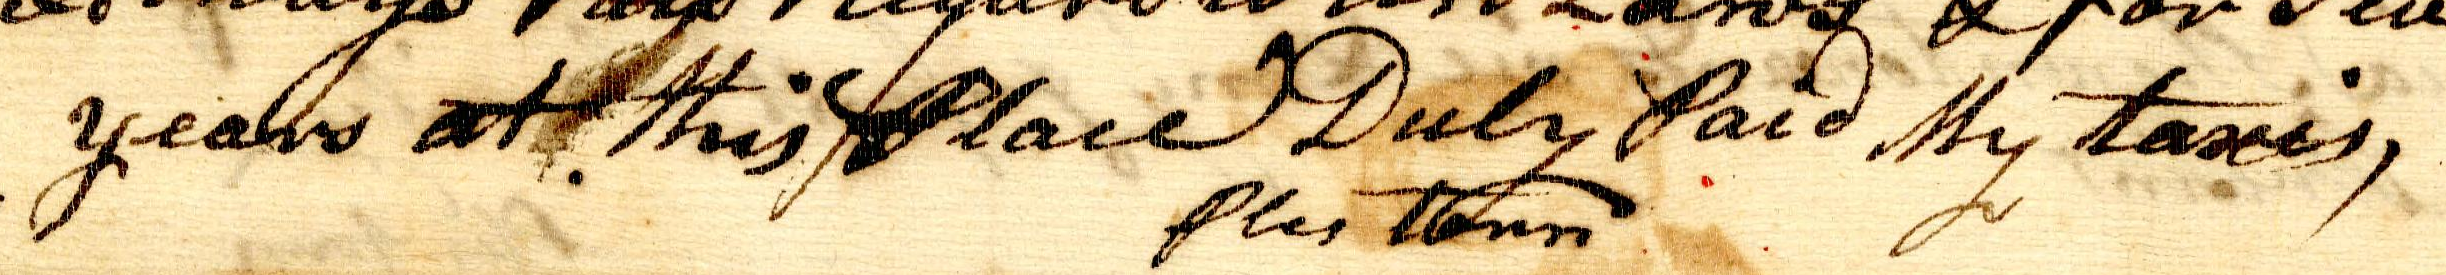years at this Place Duly Paid My taxes,
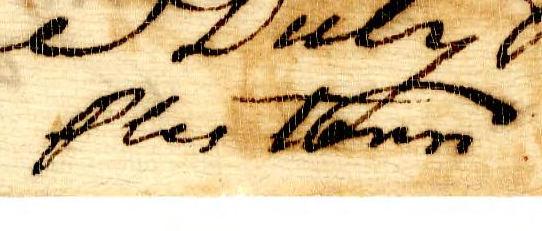Ples town
